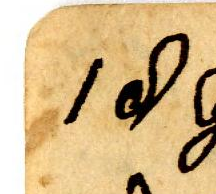18
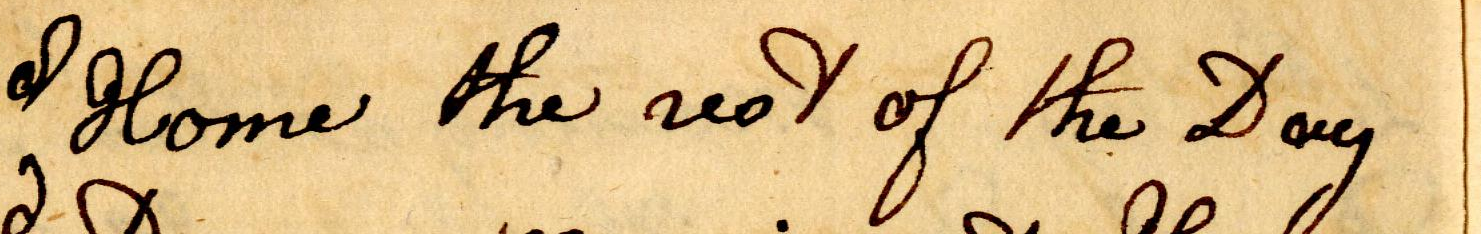Home the rest of the Day
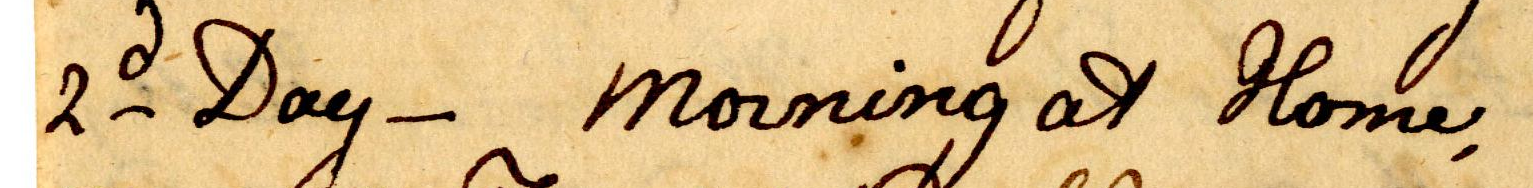2^d Day- Morning at Home,
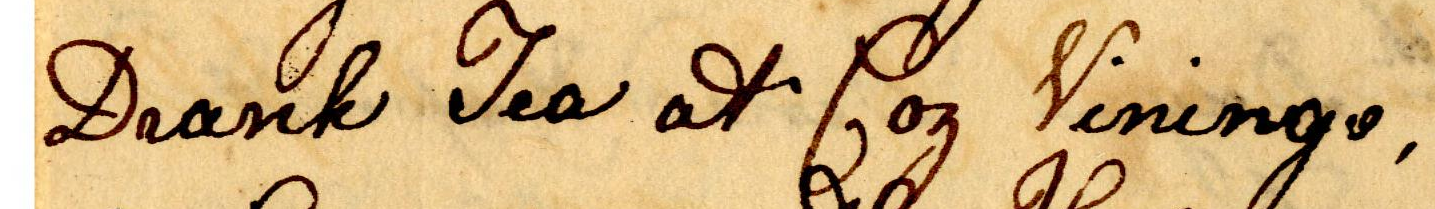Drank Tea at Coz Vinings,
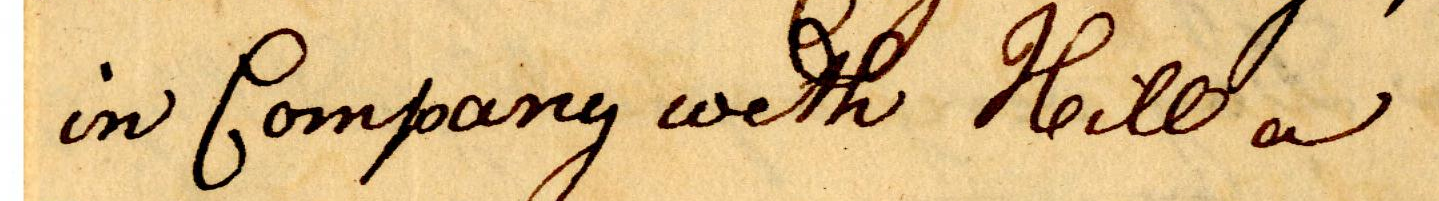in Company with Hill a
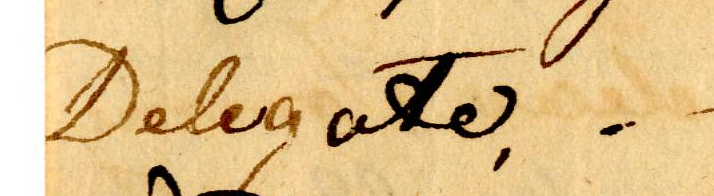Delegate, -
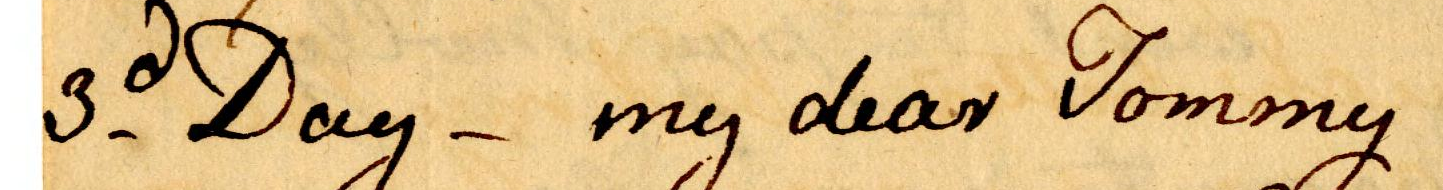3^d Day- my dear Tommy
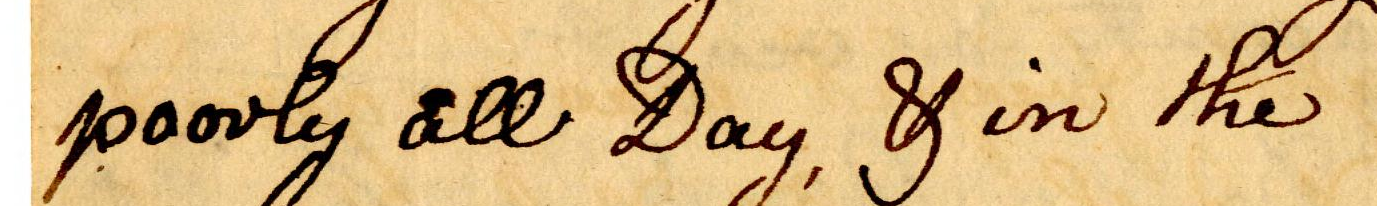poorly all Day, & in the
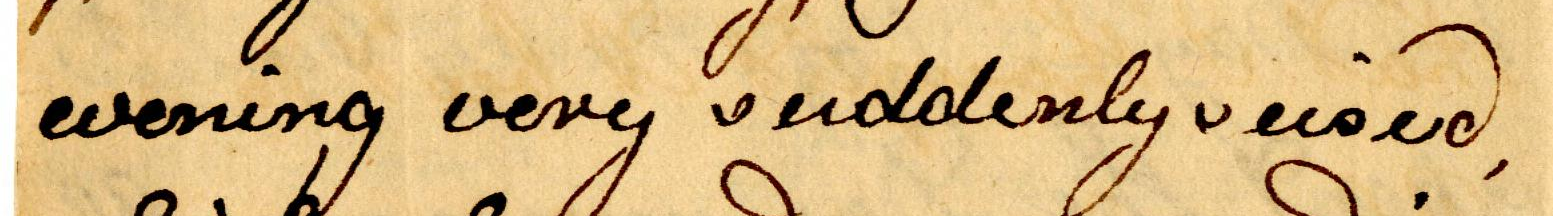evening very suddenly seised,
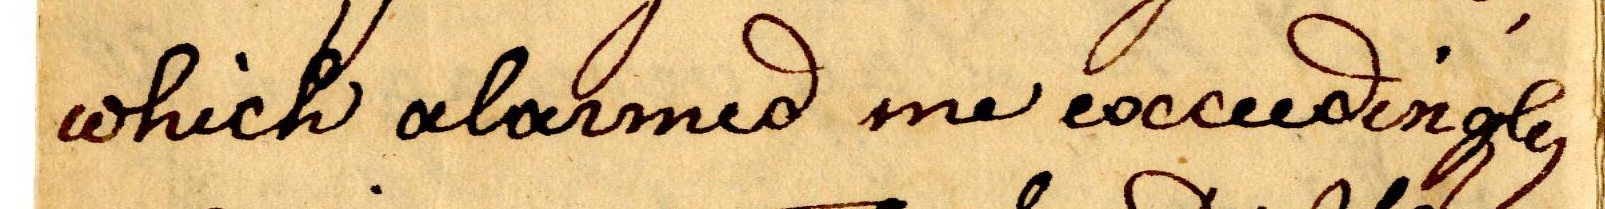which alarmed me exceedingly
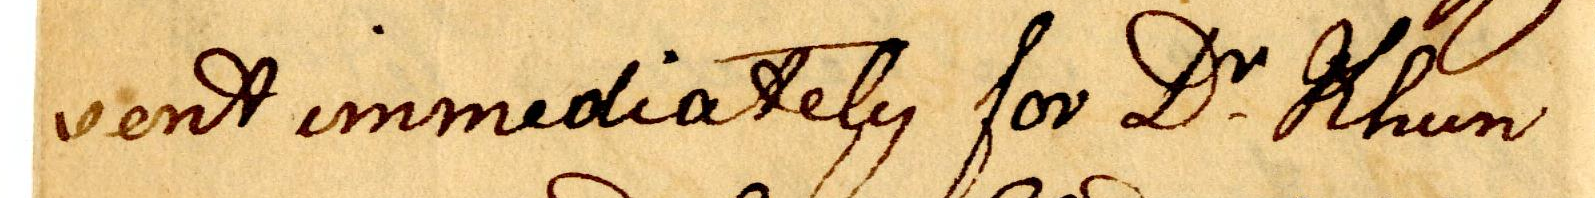sent immediately for D^r. Khun
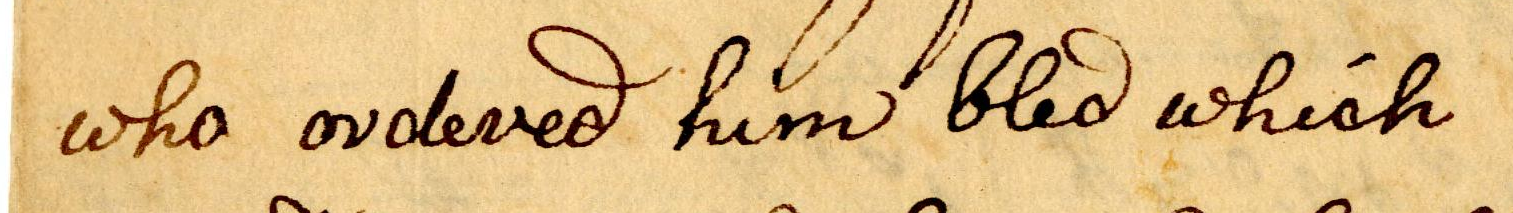who ordered him bled which
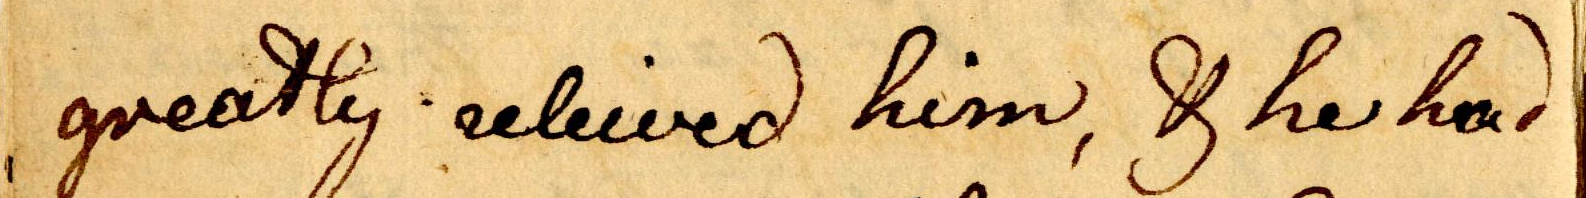greatly releived him, & he had
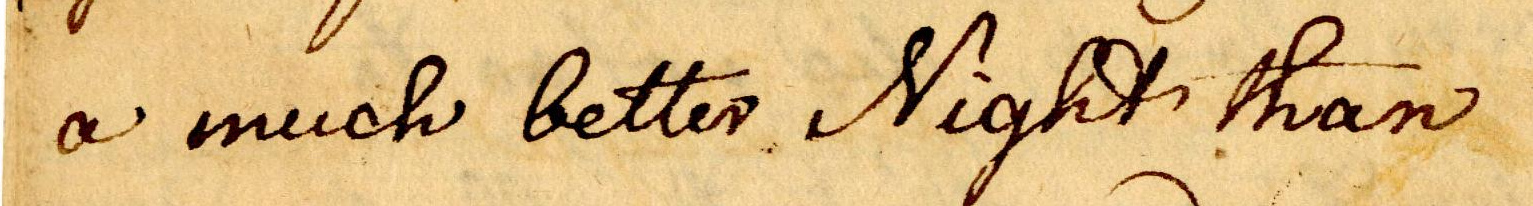a much better Night than
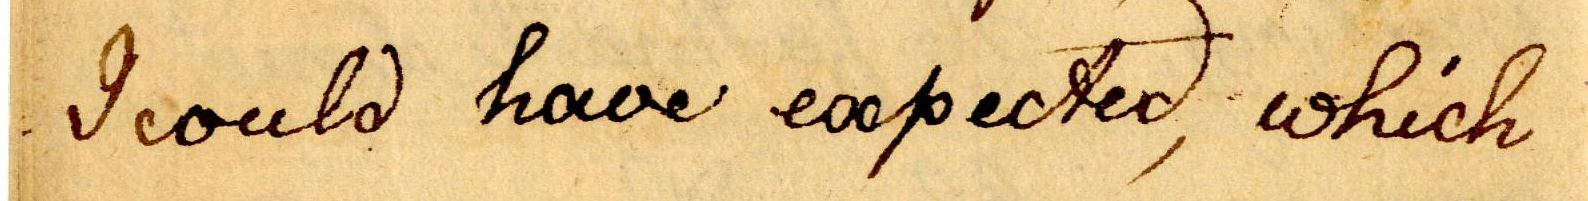I could have expected, which
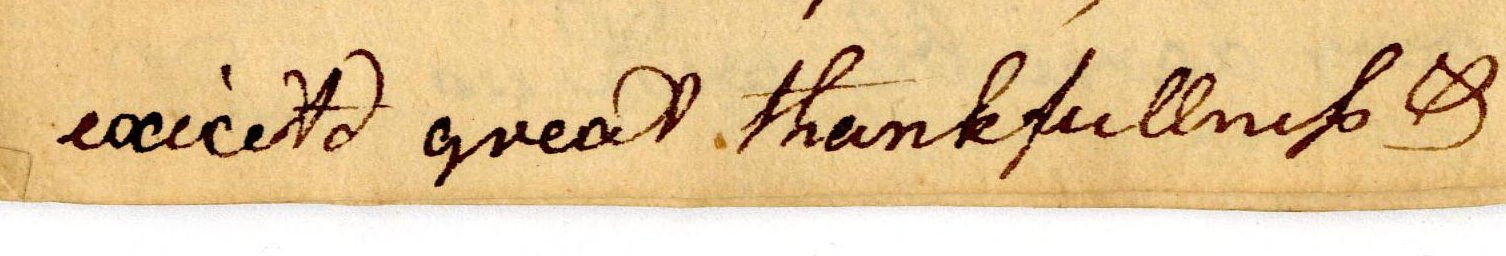exicetd great thankfullness &
